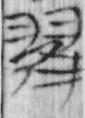翟
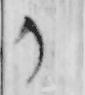人
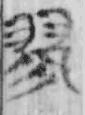翏
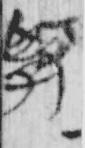○（賢）
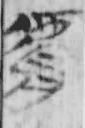膚
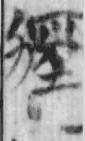勁
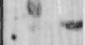壬
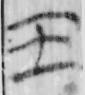王
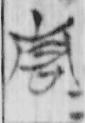青
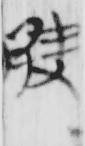○（雘）
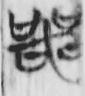噩
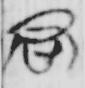君
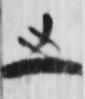之
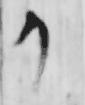人
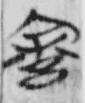舒
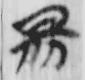昜
